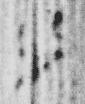交
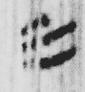㠯
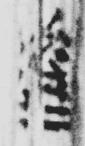道
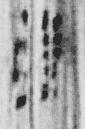者
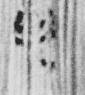也
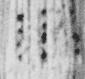不
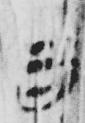同
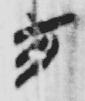方
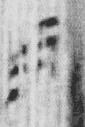而
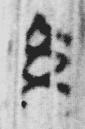交
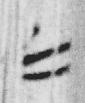㠯（以）
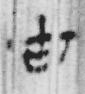古（故）
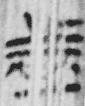者
